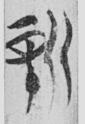新（親）
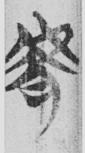○（乎）
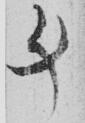父
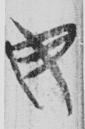母
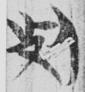死
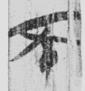不
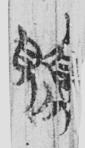○（顧）
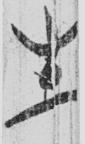生
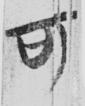可
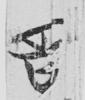言
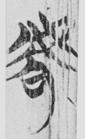○（乎）
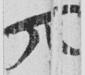亓（其）
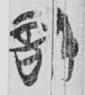信
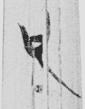也
